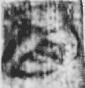冒
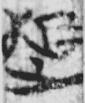○（宣）
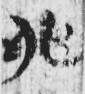卯
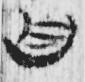自
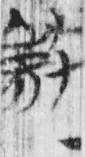殺
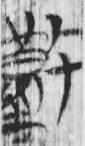○（勤）
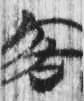客
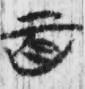百
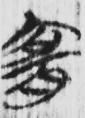宜
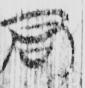君
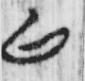㠯
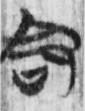命
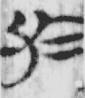於
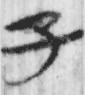子
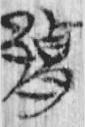宛
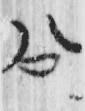公
